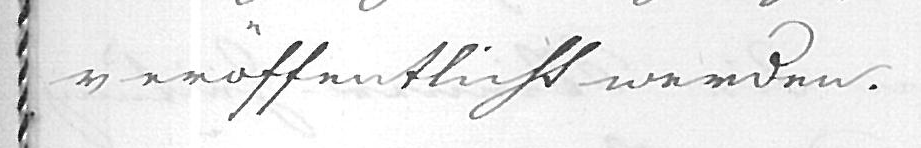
veröffentlicht werden.
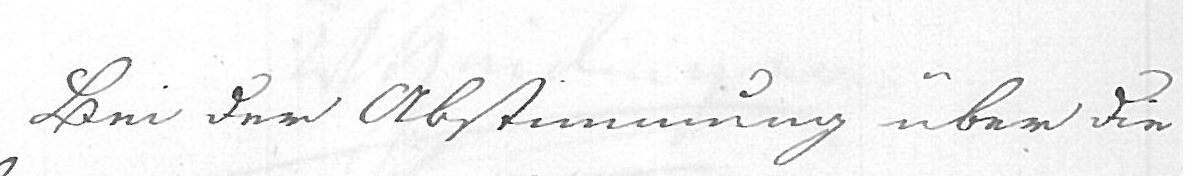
Bei der Abstimmung über die
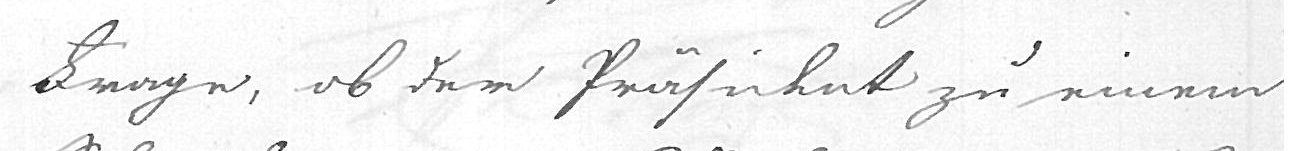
Frage, ob der Präsident zu einem
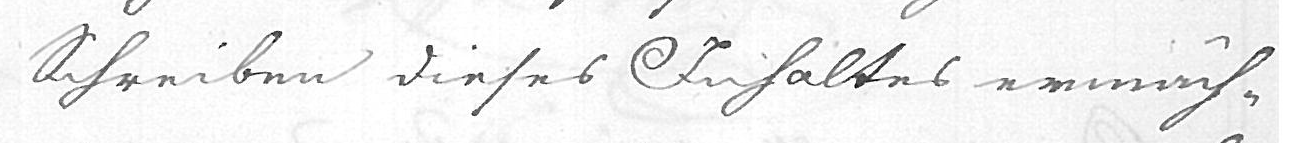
Schreiben dieses Inhaltes ermäch-
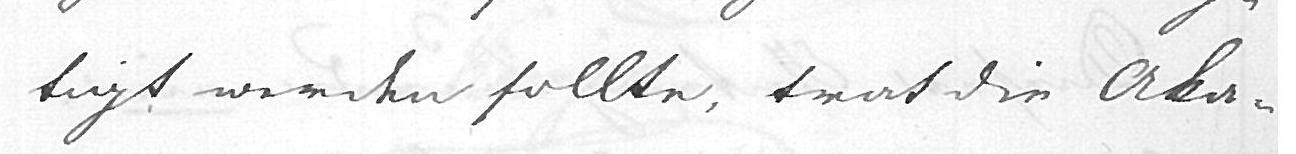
tigt werden sollte, trat die Aka-
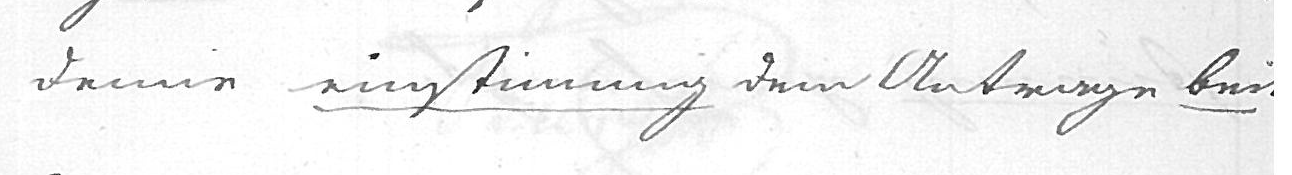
demie einstimmig dem Antrage bei.
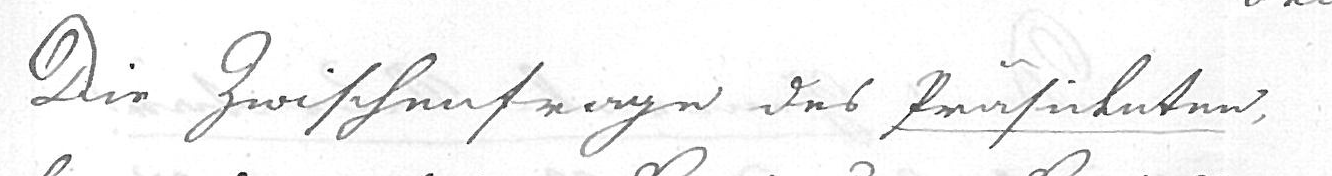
Die Zwischenfrage des Präsidenten,
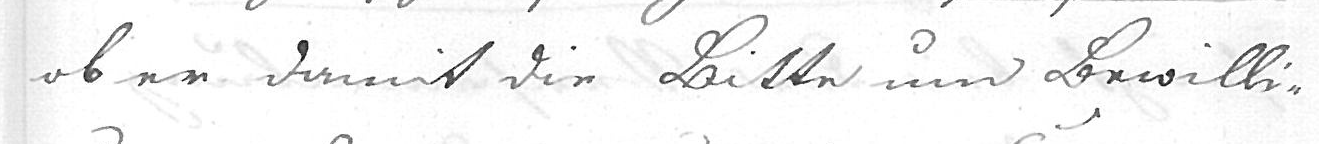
ob er damit die Bitte und Bewilli-
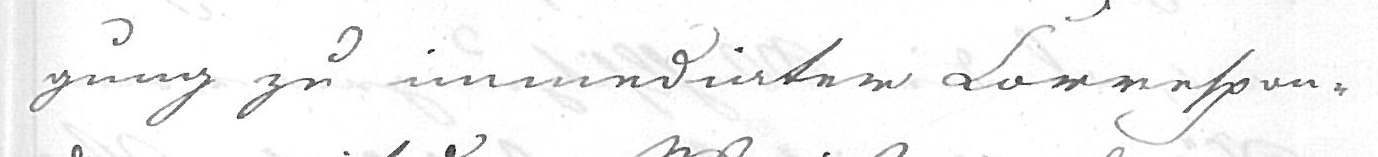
gung zu immediater Correspon-
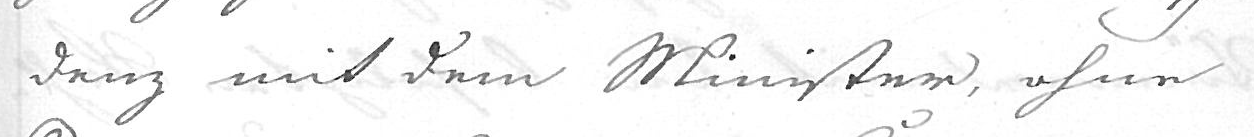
denz mit dem Minister, ohne
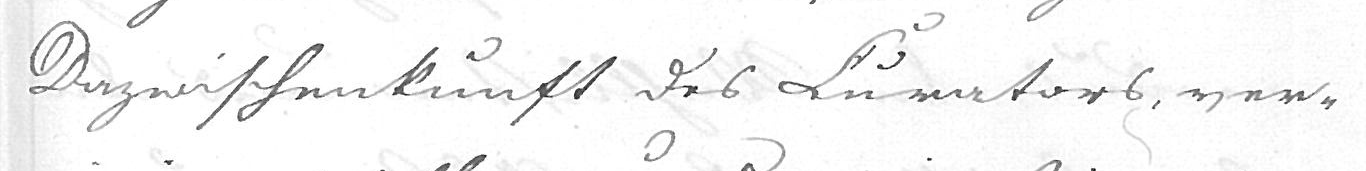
Dazwischenkunft des Curators, ver-
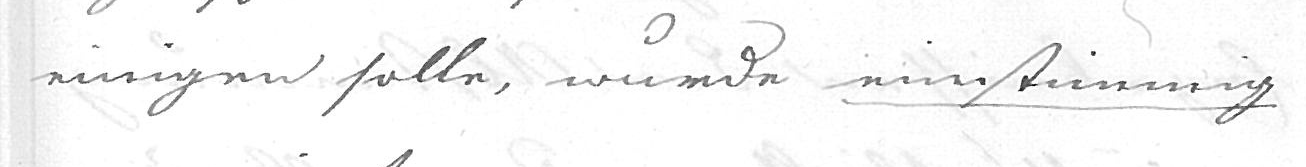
einigen solle, wurde einstimmig
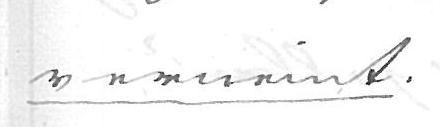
verneint.
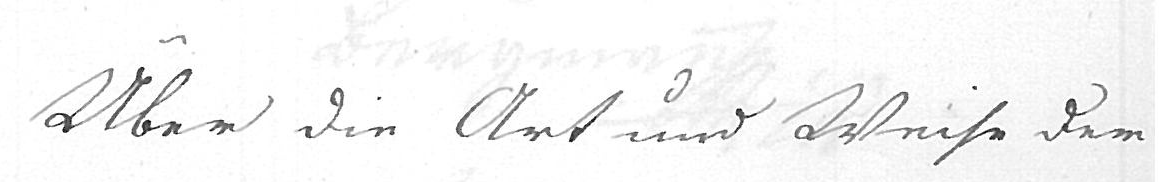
Über die Art und Weise der
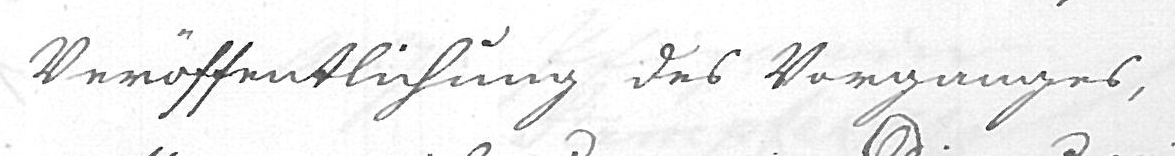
Veröffentlichung des Vorganges,
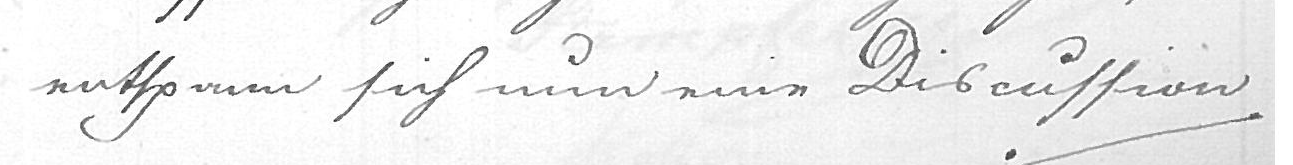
entspann sich nun eine Discussion
